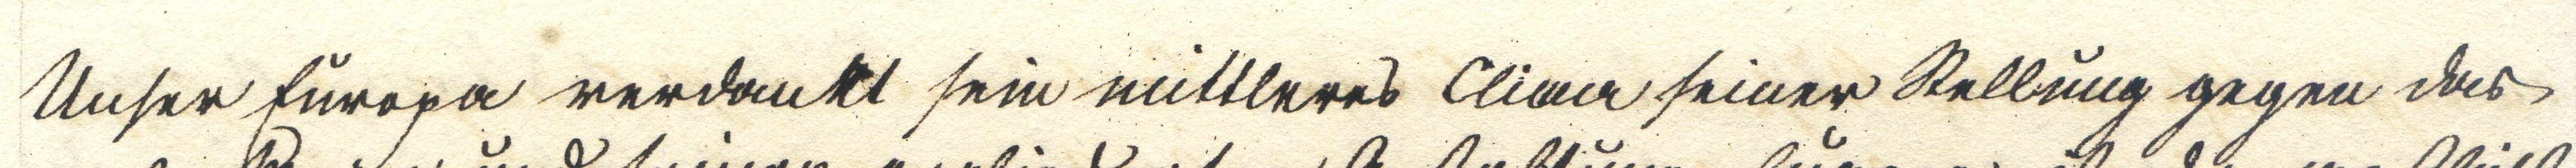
Unser Europa verdankt sein mittleres Clima seiner Stellung gegen das
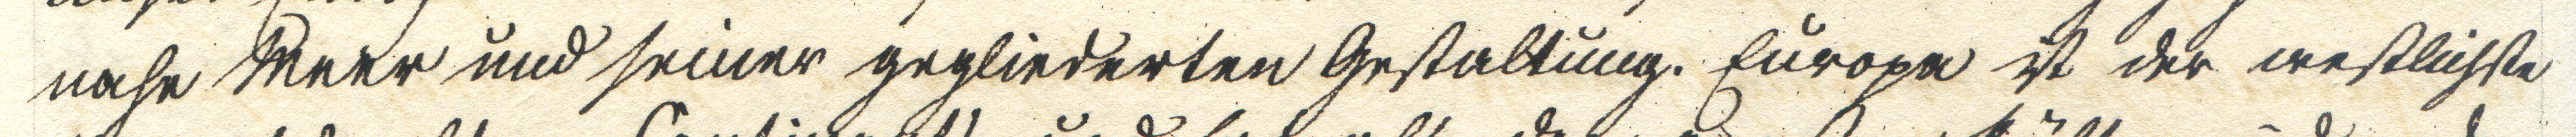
nahe Meer und seiner gegliederten Gestaltung. Europa ist der westlichste
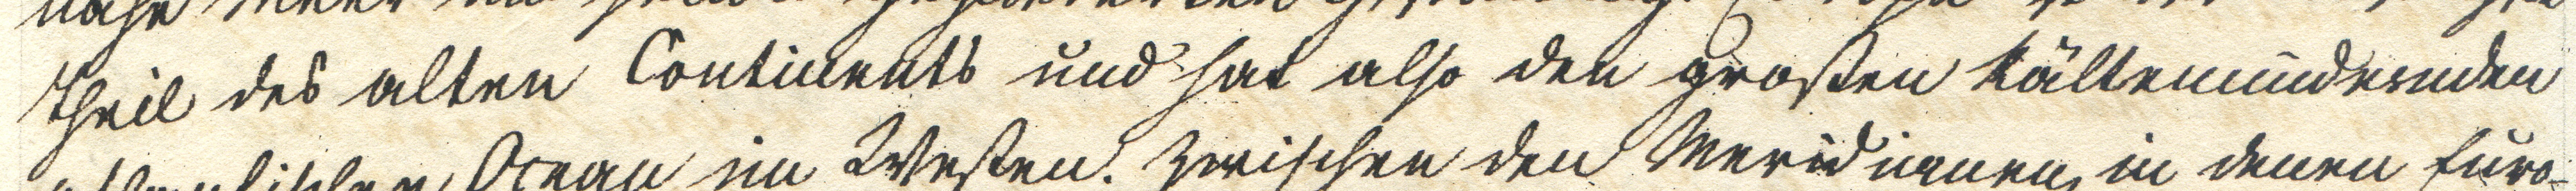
Theil des alten Continents und hat also den großen kältemindernden
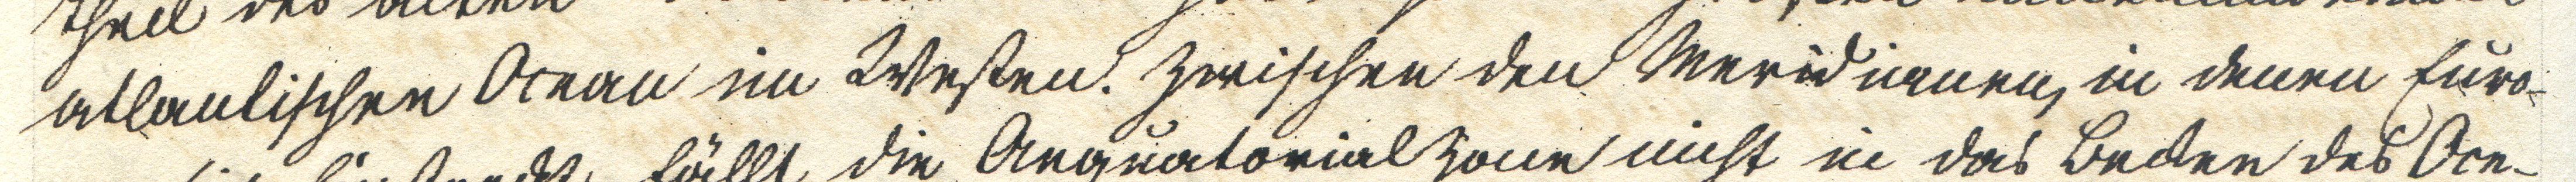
atlantischen Ocean im Westen. Zwischen den Meridianen, in denen Euro-
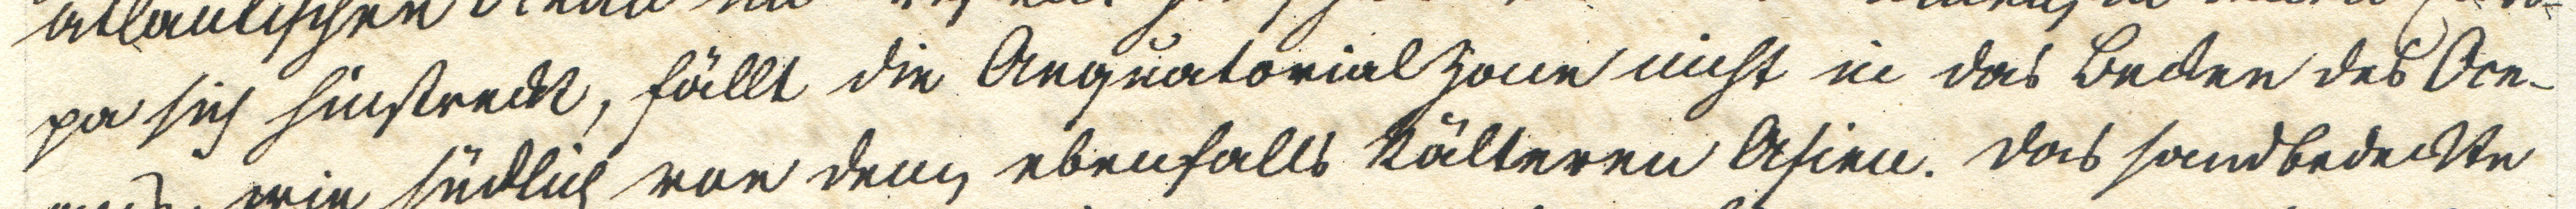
pa sich hinstreckt, fällt die AequatorialZone nicht in das Becken des Oce-
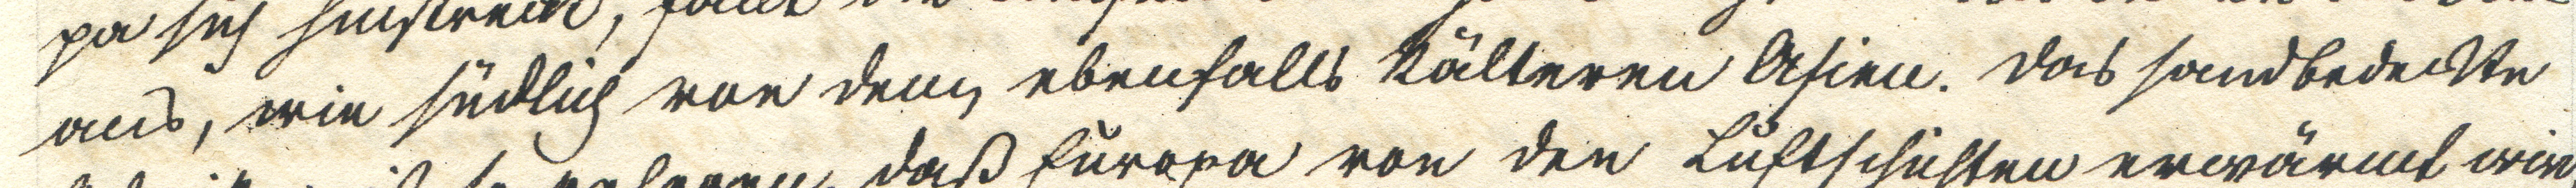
ans, wie südlich von dem, ebenfalls kälteren Asien. Das sandbedeckte
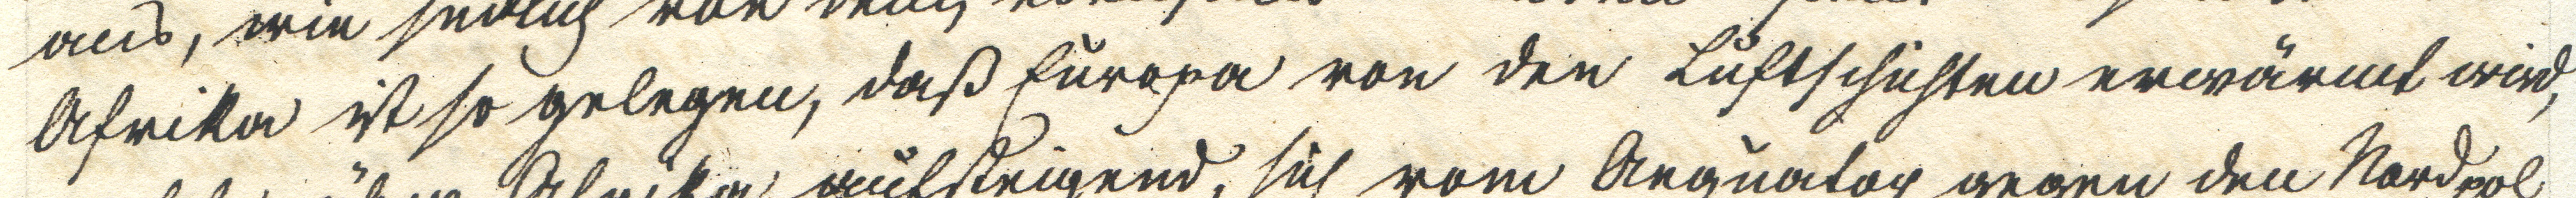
Afrika ist so gelegen, daß Europa von den Luftschichten erwärmt wird,
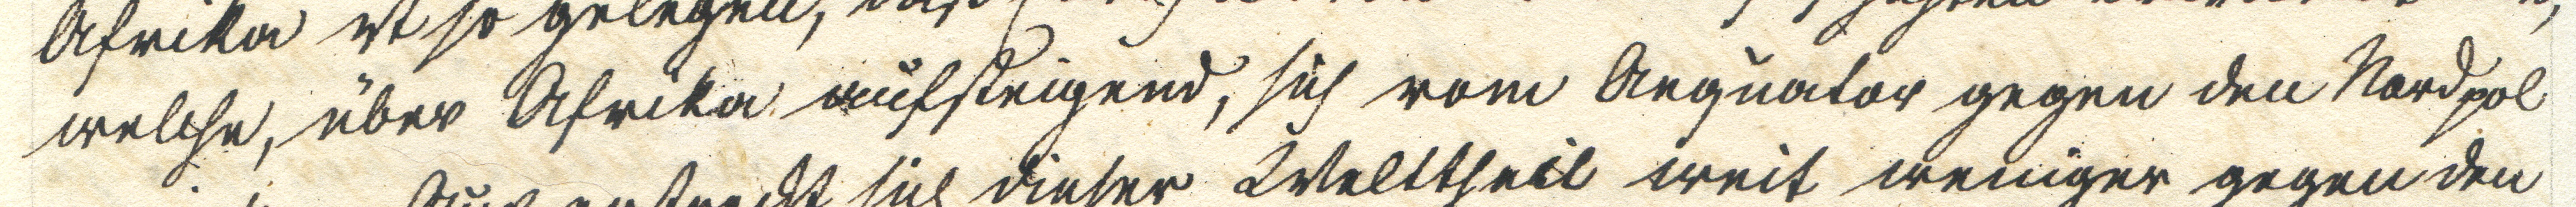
welche, über Afrika aufsteigend, sich vom Aequator gegen den Nordpol
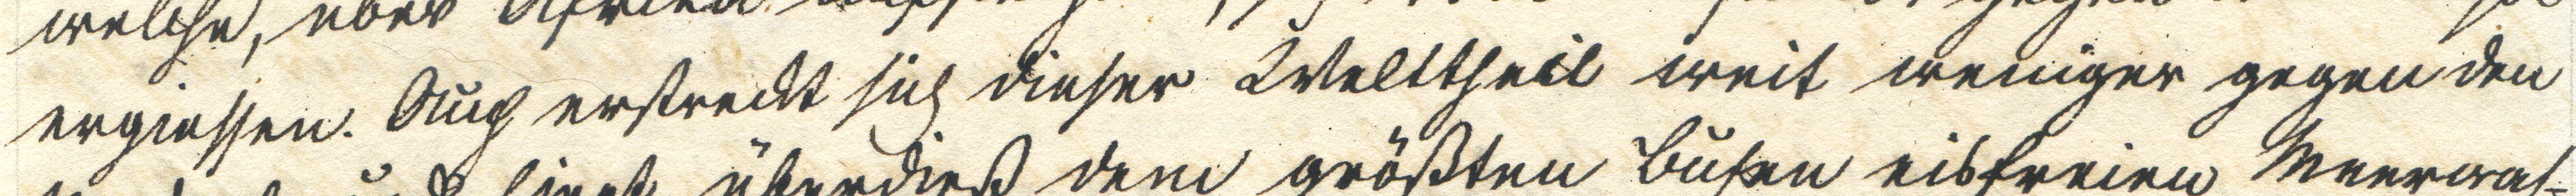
ergiessen. Auch erstreckt sich dieser Welttheil weit weniger gegen den
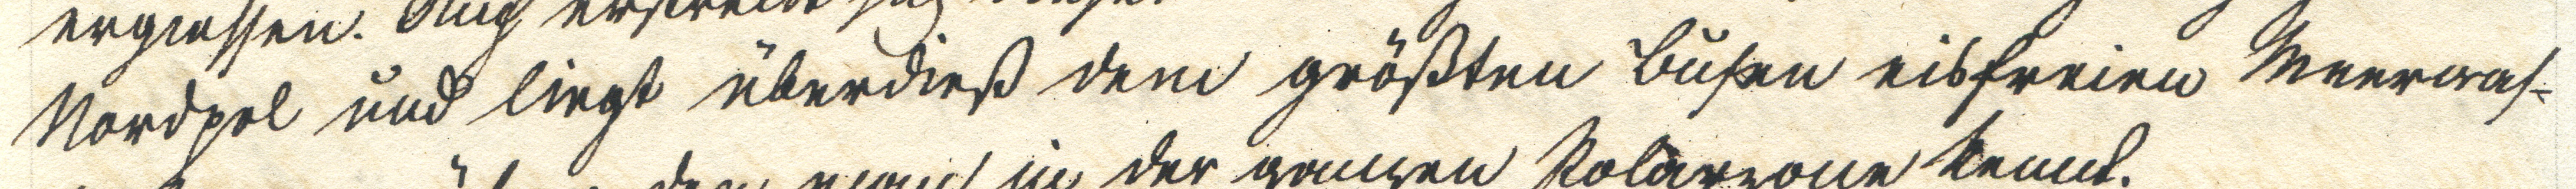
Nordpol und liegt überdieß dem größten Busen eisfreien Meerwas-
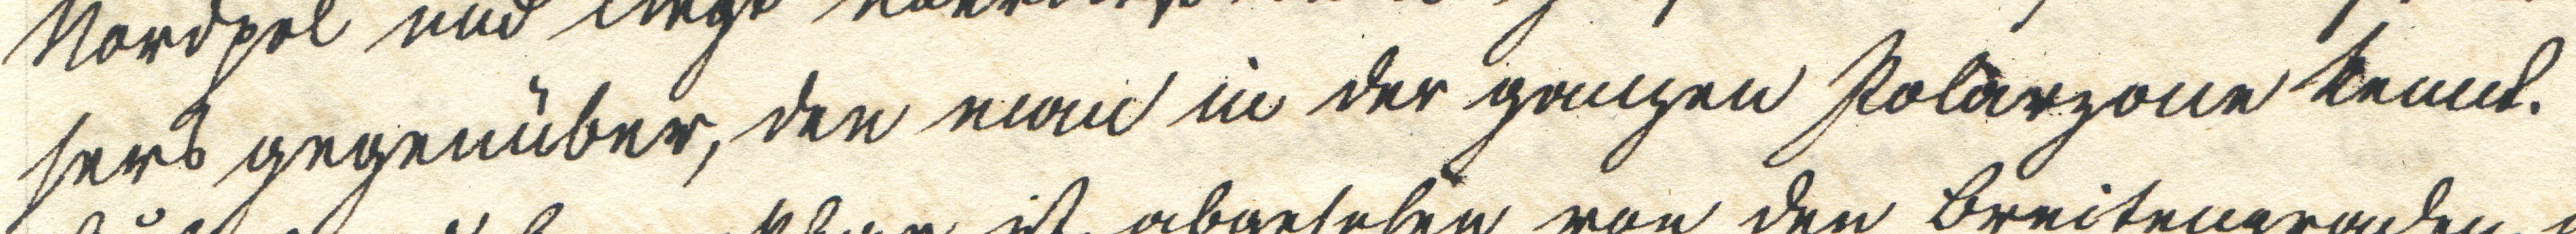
sers gegenüber, den man in der ganzen Polarzone kennt.
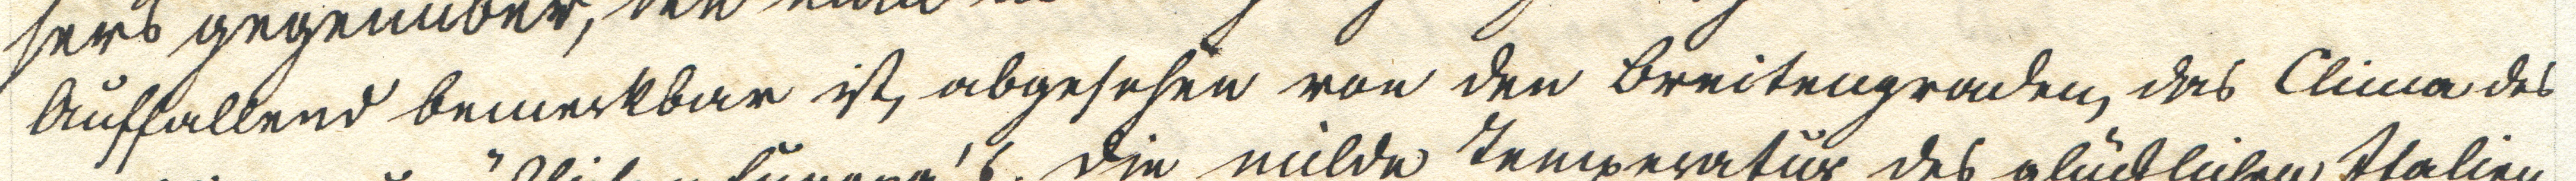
Auffallend bemerkbar ist, abgesehen von den Breitengraden, das Clima des
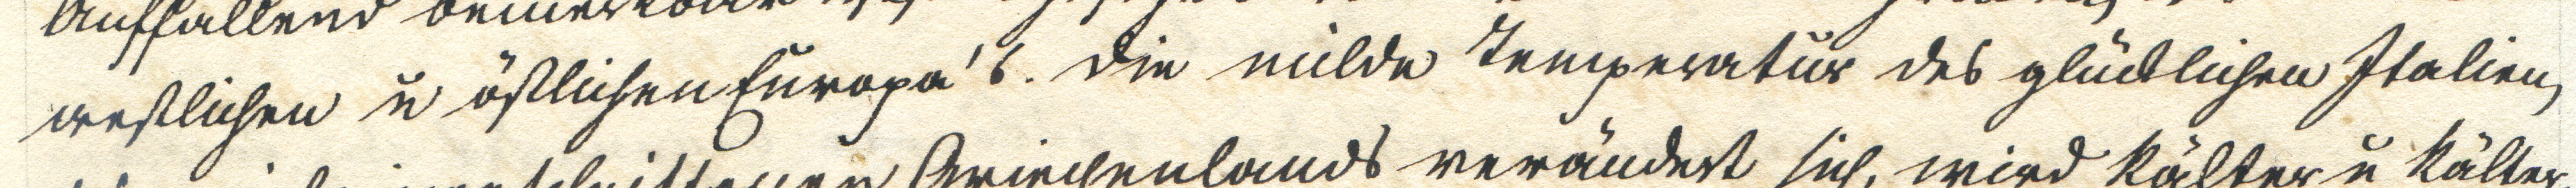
westlichen u östlichen Europa’s. Die milde Temperatur des glücklichen Italien,
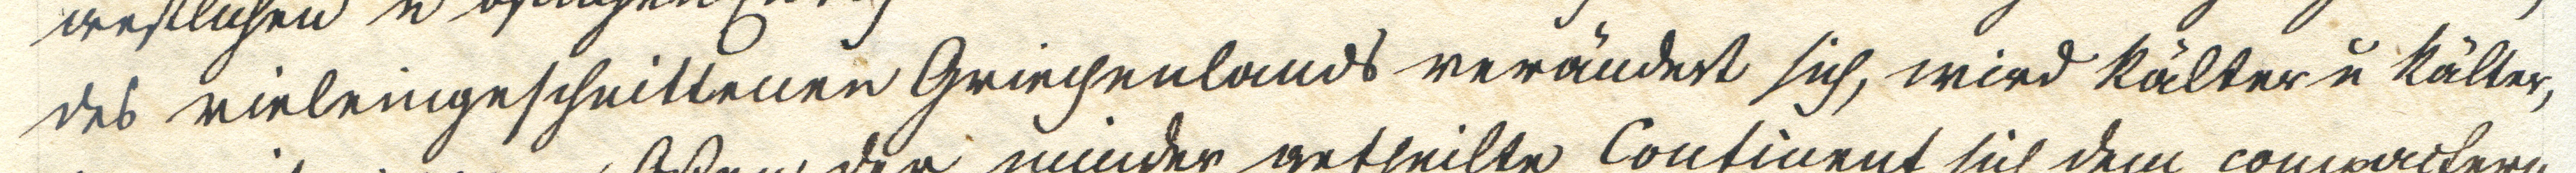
des vieleingeschnittenen Griechenlands verändert sich, wird kälter u kälter,
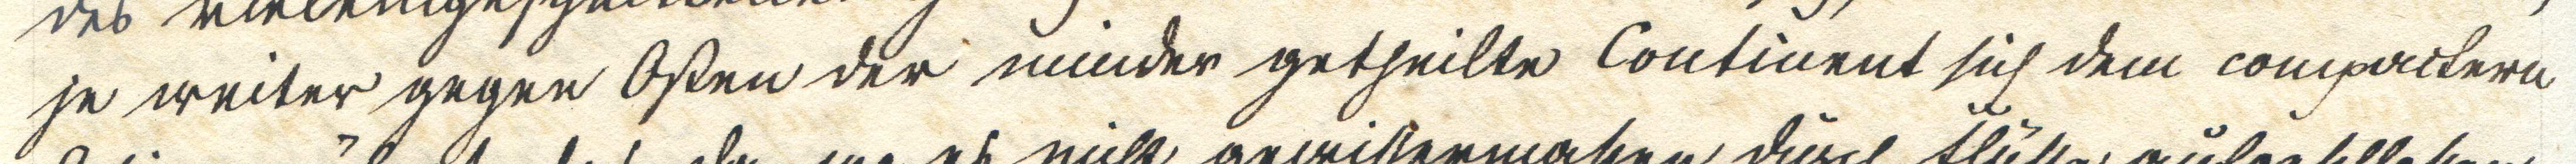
je weiter gegen Osten der minder getheilte Continent sich dem compactern
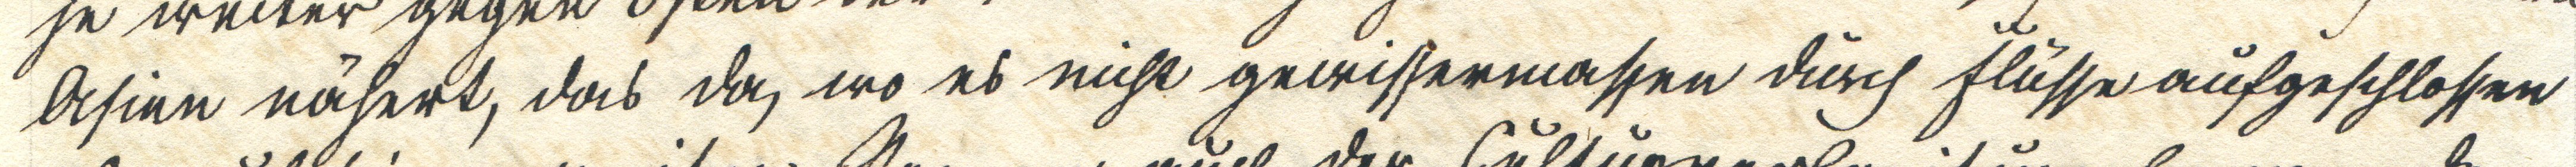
Asien nähert, das da, wo es nicht gewissermassen durch Flüsse aufgeschlossen
